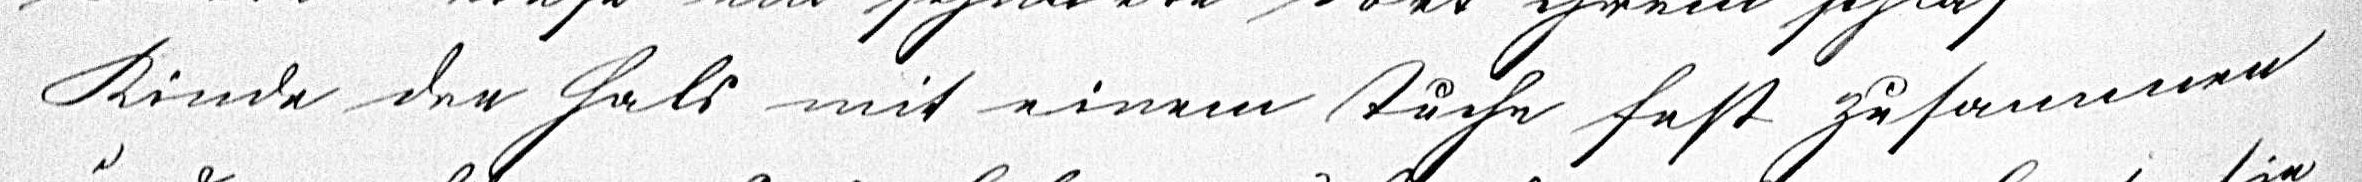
Kinde den Hals mit einem Tuche fest zusammen
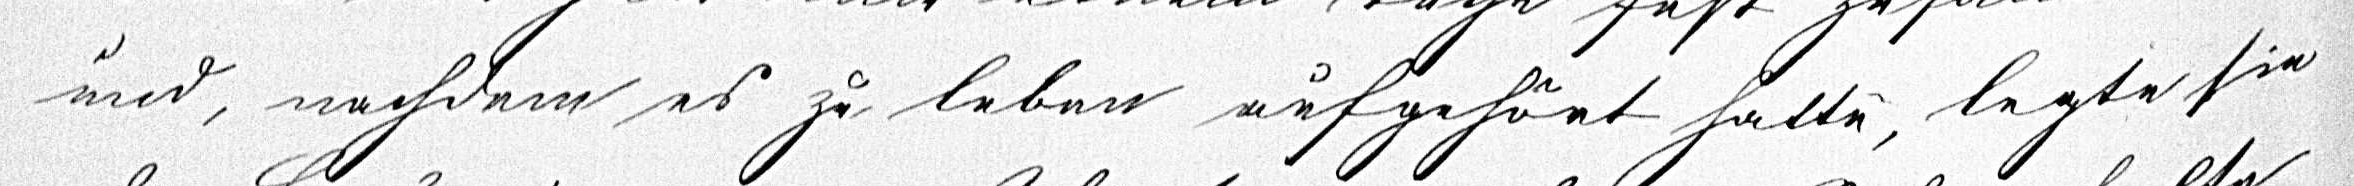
und, nachdem es zu leben aufgehört hatte, legte sie
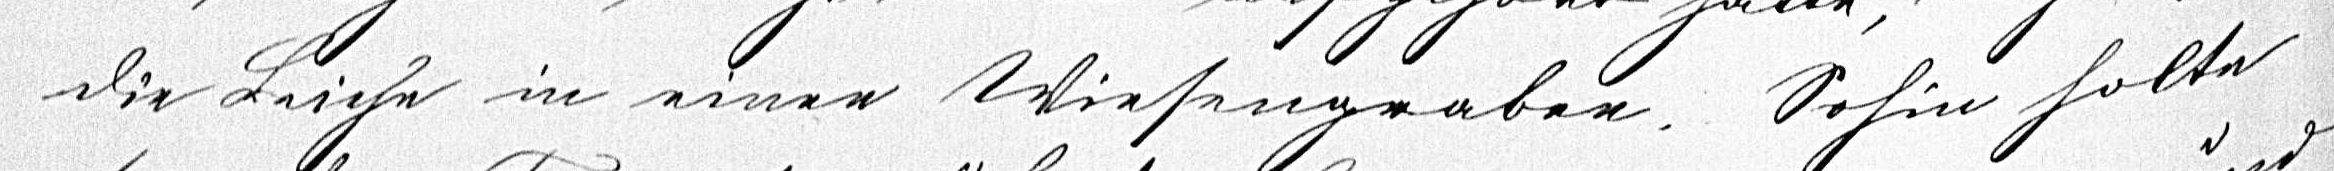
die Leiche in einen Wiesengraben. Sohin holte
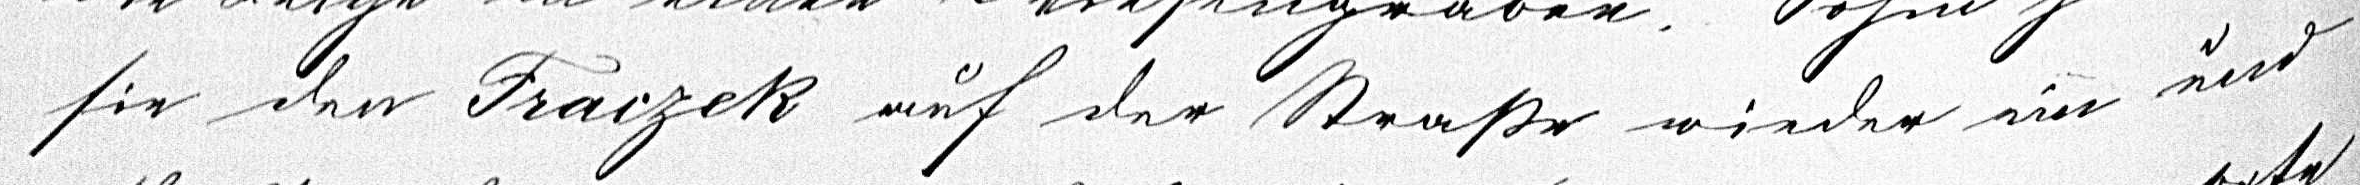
sie den Fraczek auf der Straße wieder ein und
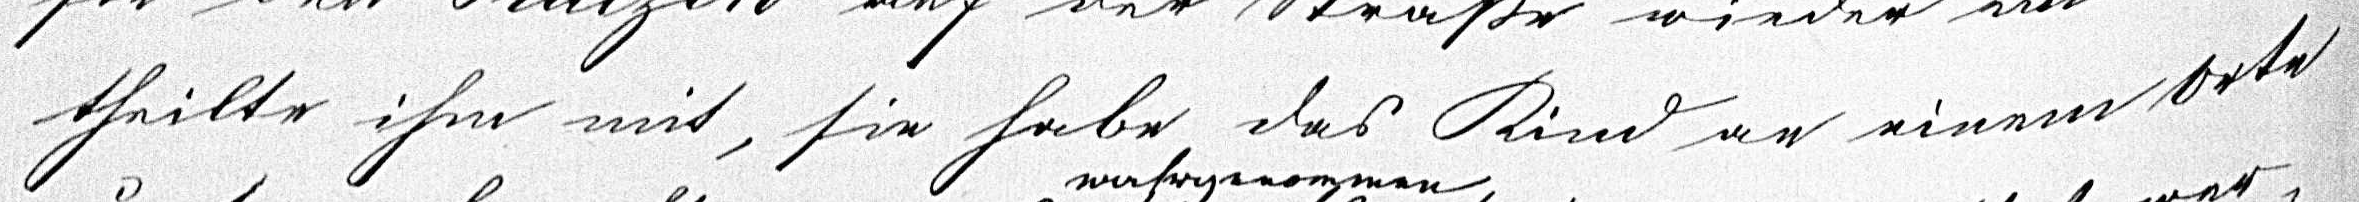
theilte ihm mit, sie habe das Kind an einem Orte
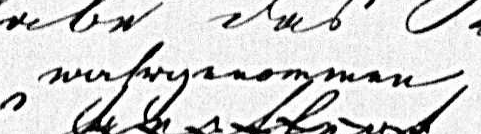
wahrgenommen
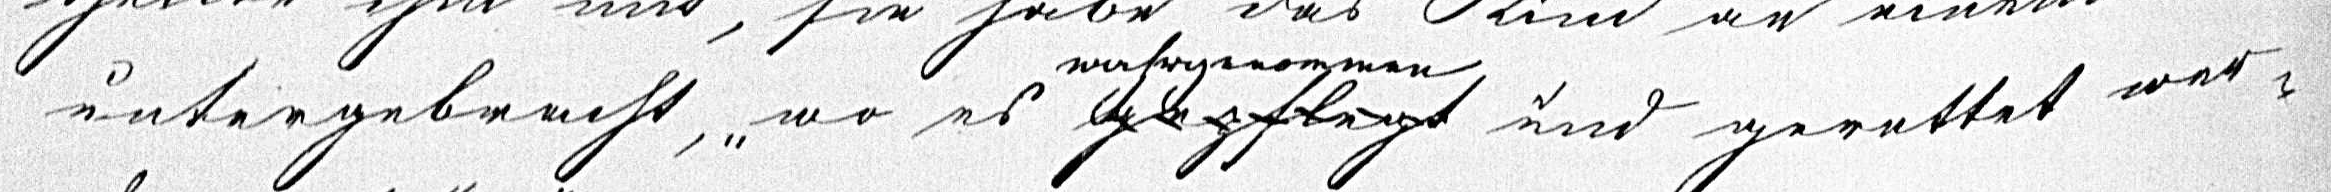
untergebracht, „wo es und gerettet wer¬
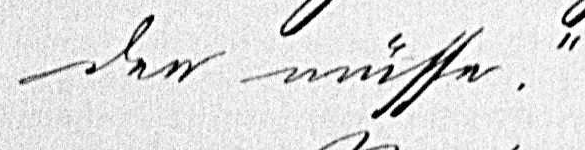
den müsse.“
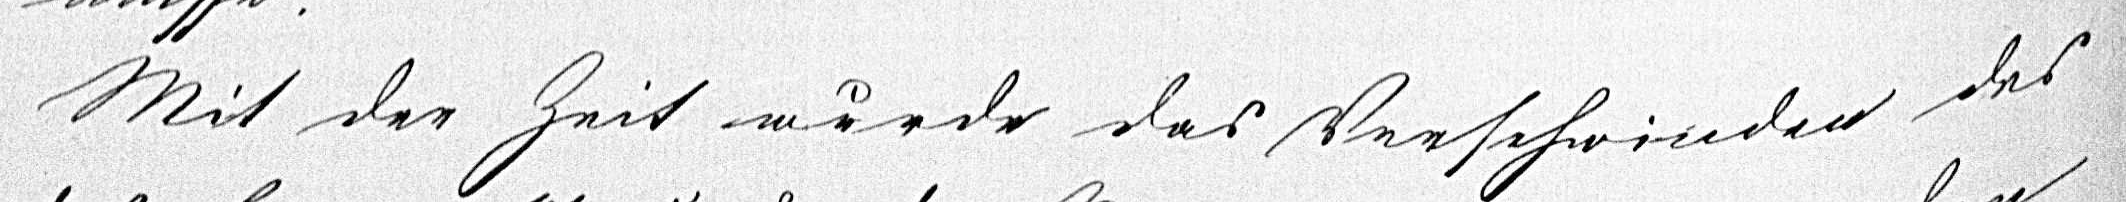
Mit der Zeit wurde das Verschwinden des
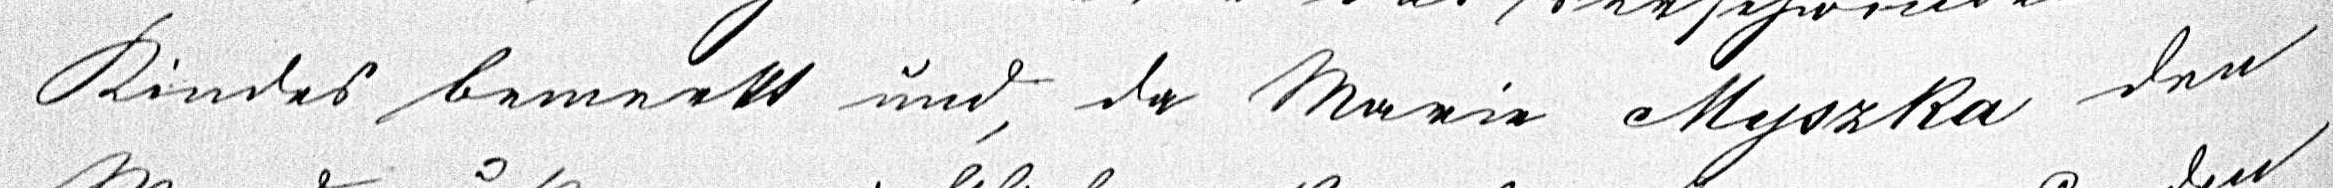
Kindes bemerkt und, da Marie Myszka den
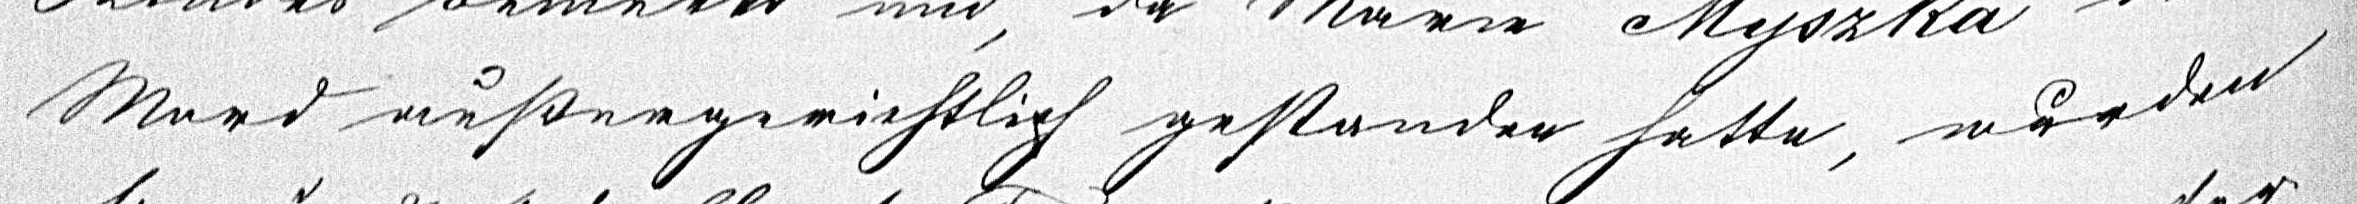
Mord außergerichtlich gestanden hatte, wurden
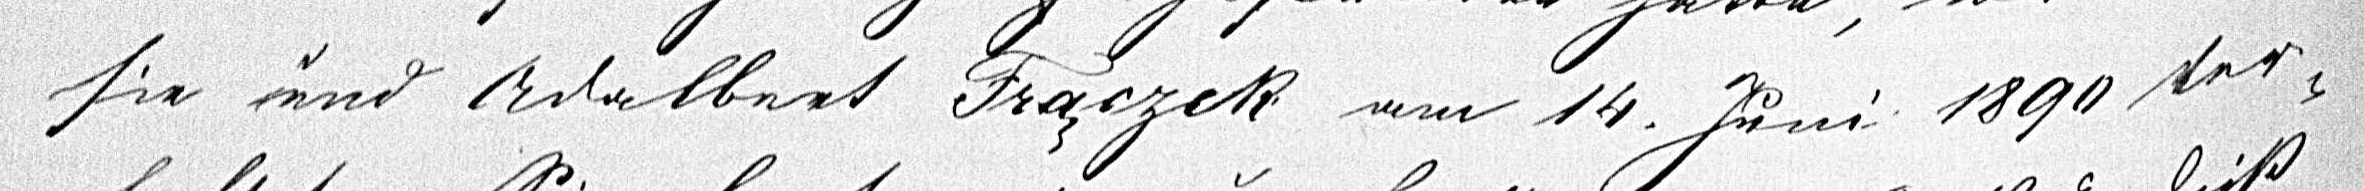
sie und Adalbert Frączek am 14. Juni 1890 ver¬
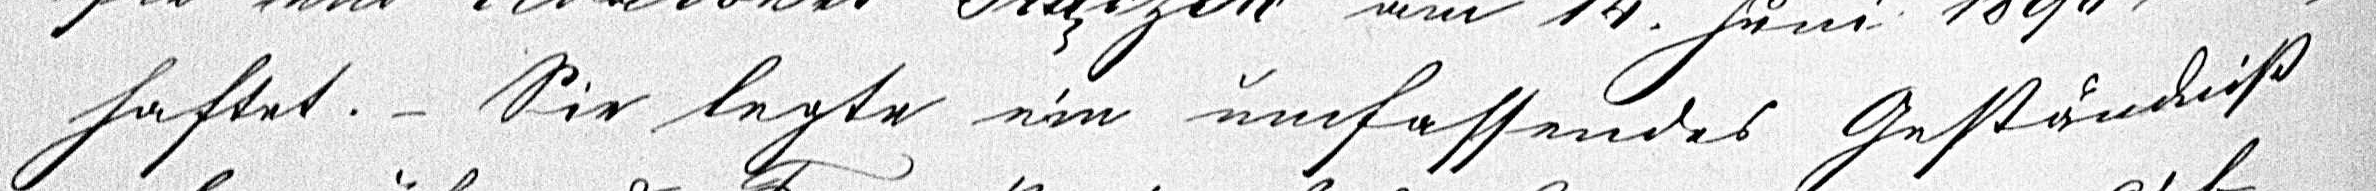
haftet.- Sie legte ein umfassendes Geständniß
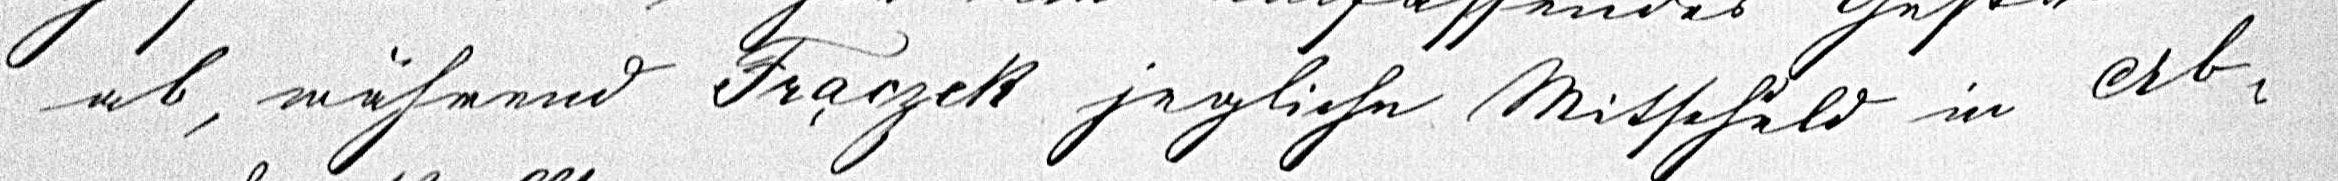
ab, mährend Frączek jegliche Mitschuld in Ab¬
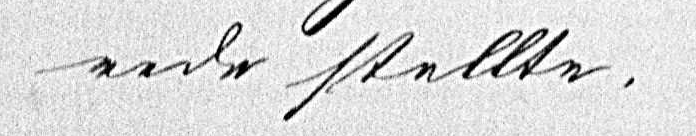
rede stellte.
